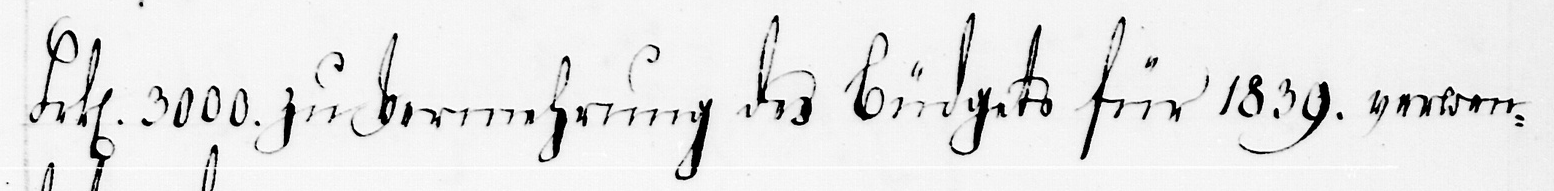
k[en]. 3000. zu Vermehrung des Büdgets für 1839. verwen¬
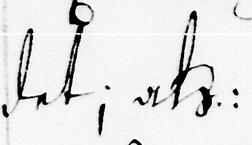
det, als:
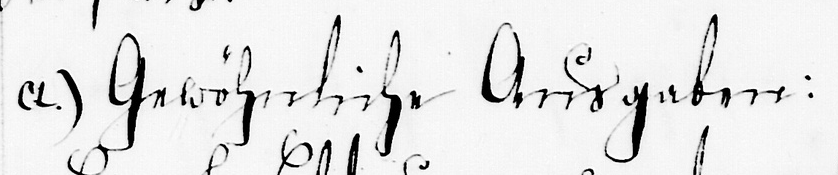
a.) Gewöhnliche Ausgaben:
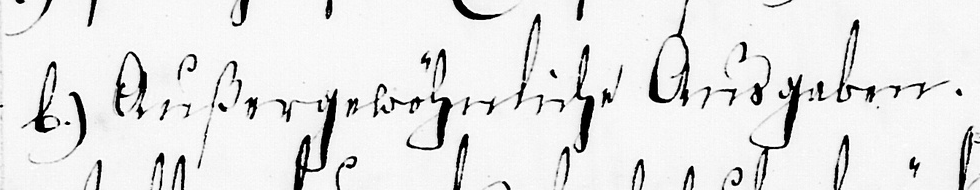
b.) Außergewöhnliche Ausgaben.
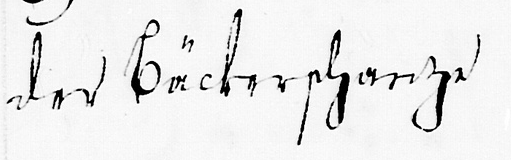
er Bäckerschanz¬
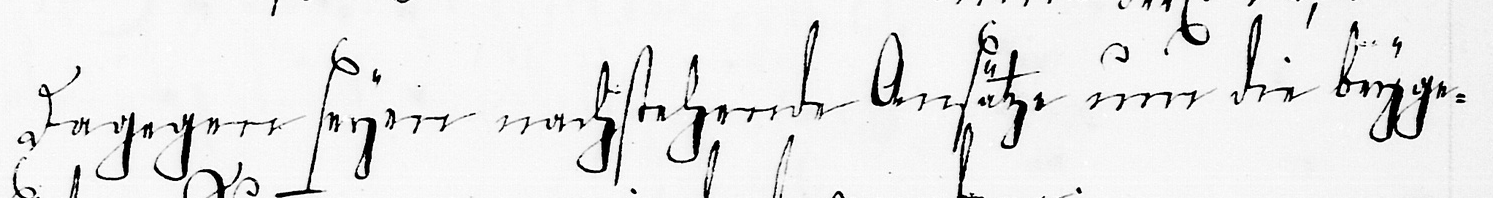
Dagegen seyen nachstehende Ansätze um die beyge¬
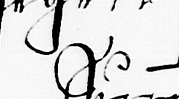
Fr¬
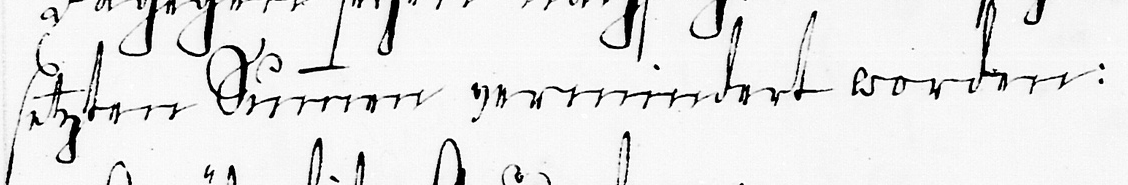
setzten Summen vermindert worden:
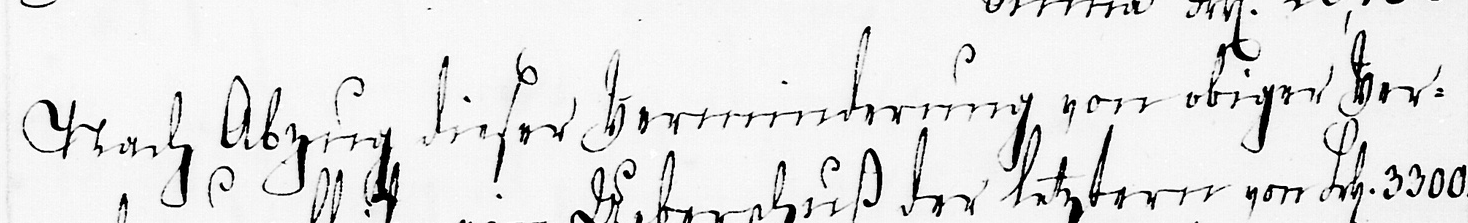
Nach Abzug dieser Verminderung von obiger Ver¬
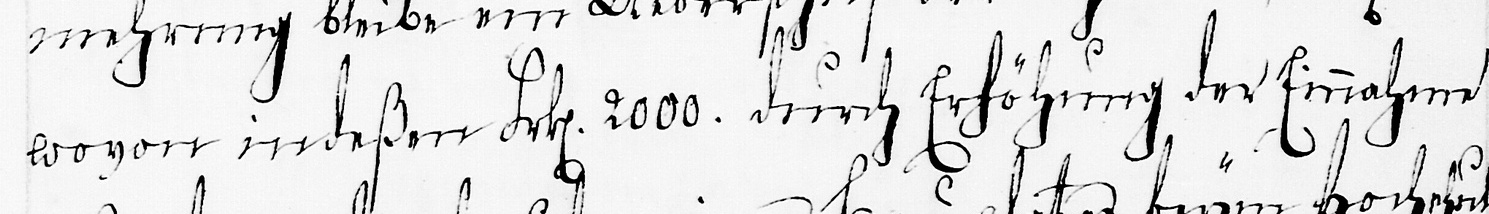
wovon indeßen Frk[en]. 2000. durch Erhöhung der Einnahme
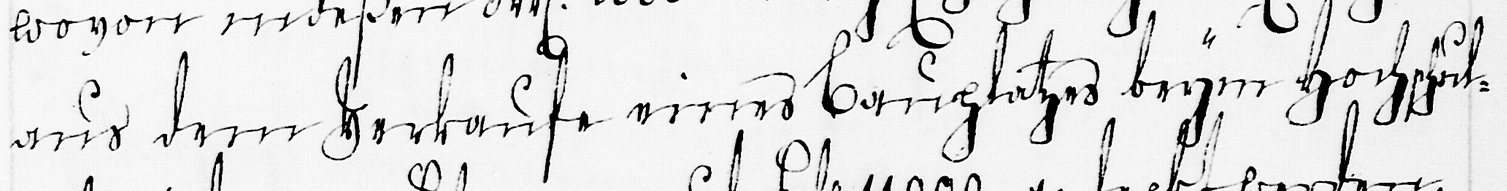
aus dem Verkaufe eines Bauplatzes beym Hochschul¬
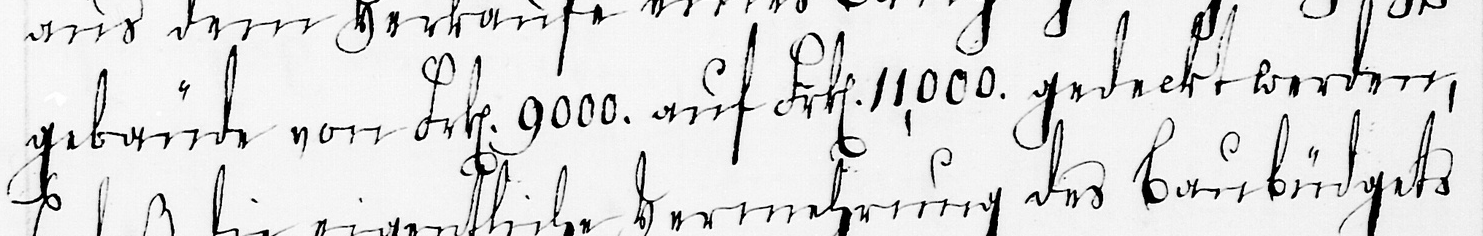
gebäude von Frk[en]. 9000. auf Frk[en]. 11,000. gedeckt werden,
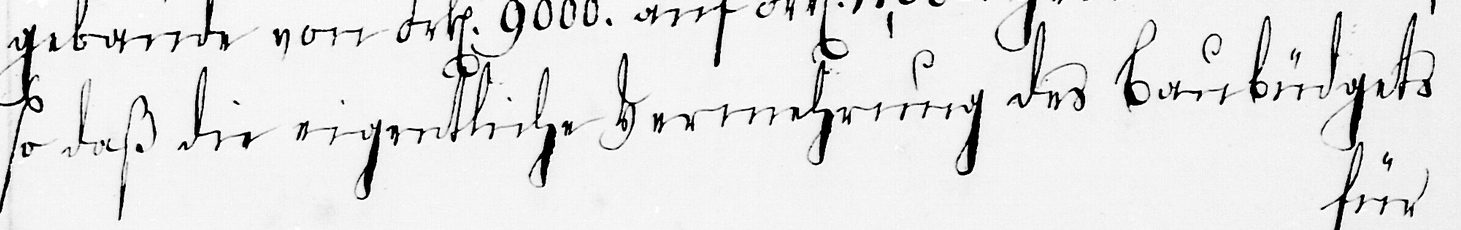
so daß die eigentliche Vermehrung des Baubüdgets
